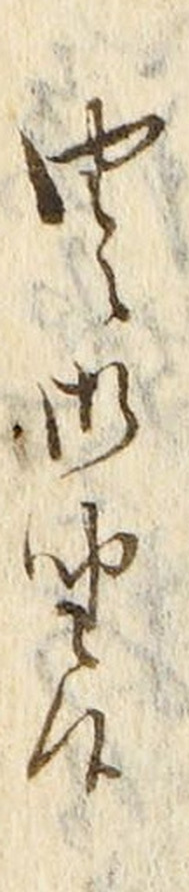由に御座候
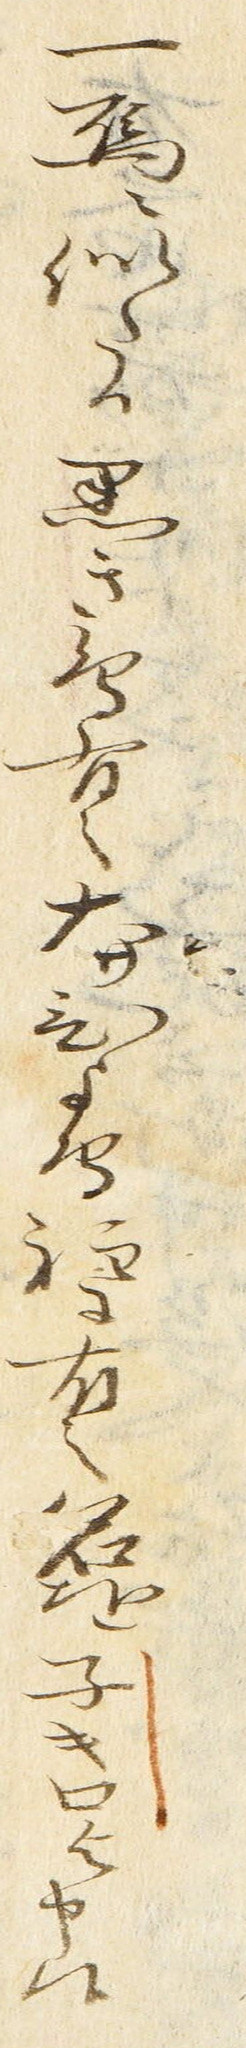一鷹に似たる黒き鳥有之大サひよ鳥程に有之名を子キロと申候
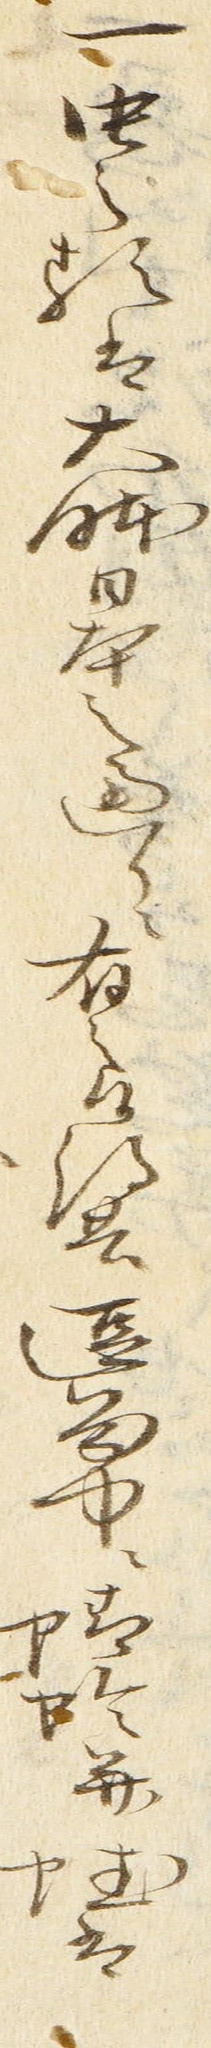一虫之類は大躰日本之辺りに有之候得共逗留中に？蛉並？は
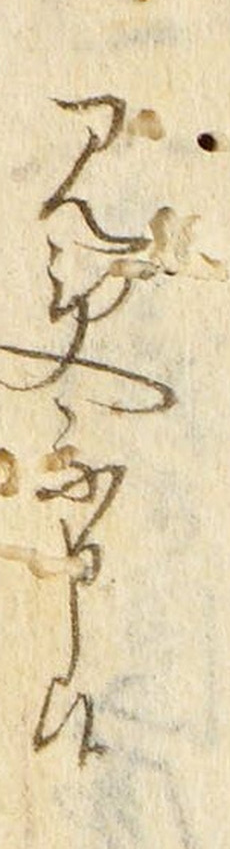見受不申候

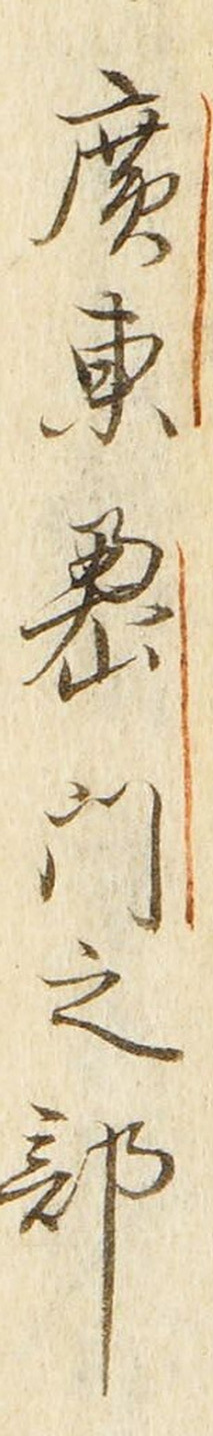広東？門之部
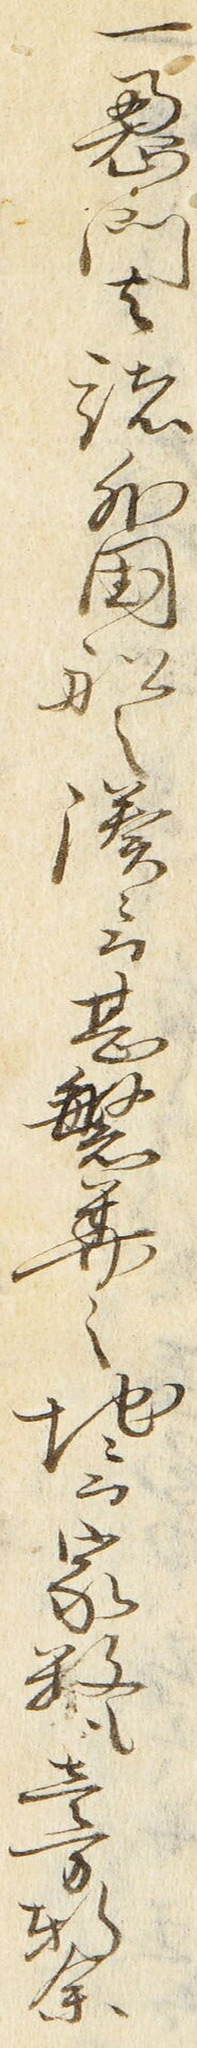一？門は諸外国船之湊に而甚繁華之地に而家数も壱万軒余
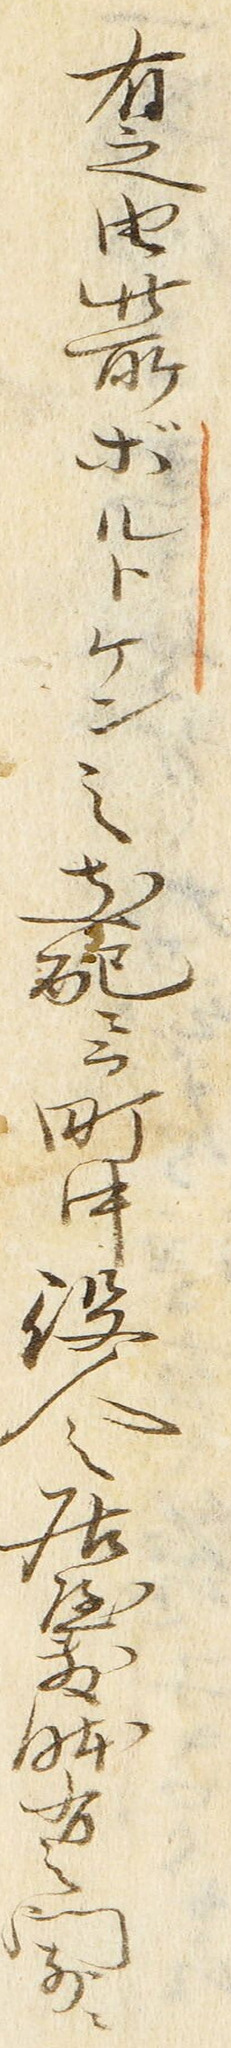有之由此所ボルトケン之支配に而町中役人之居屋敷躰有之門前に
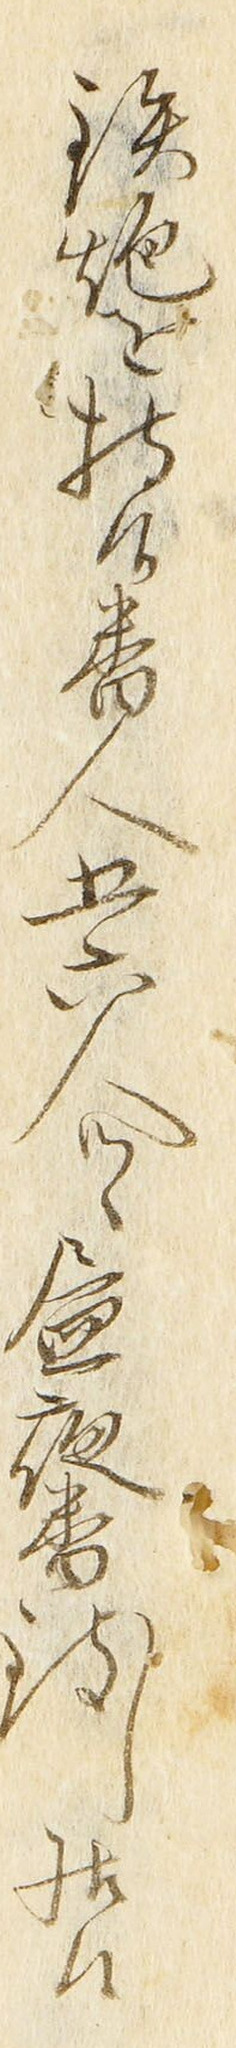鉄砲を持候番人五六人ツツ昼夜番致し居候
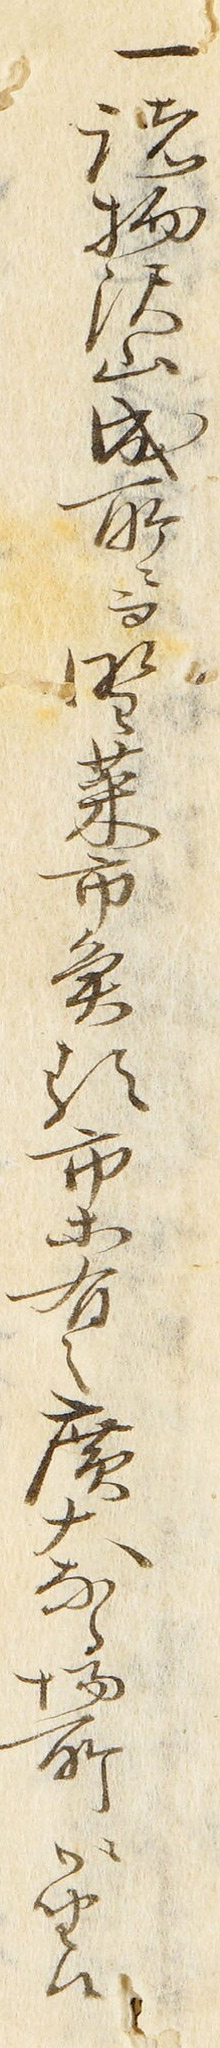一諸物沢山成所に而野菜市魚類市等有之広大なる場所に御座候
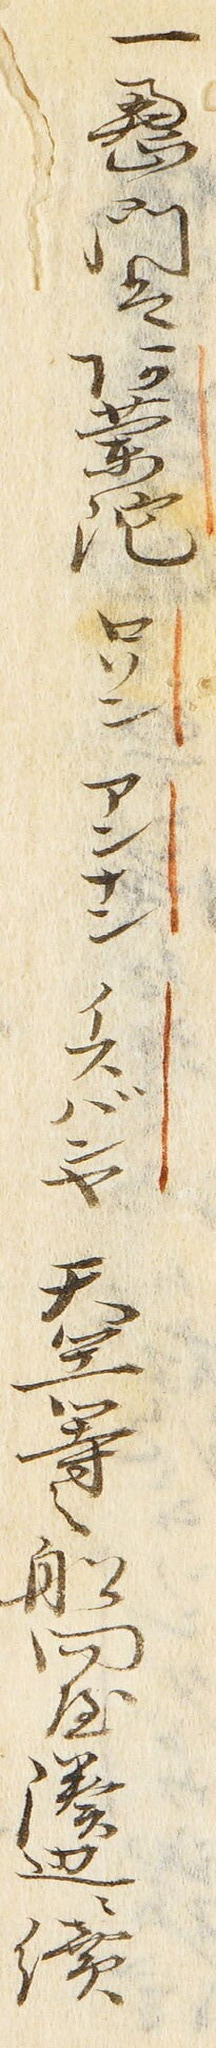一？門は阿蘭陀ロソンアンナンノースバンヤ天竺等之船四屋湊辺に続
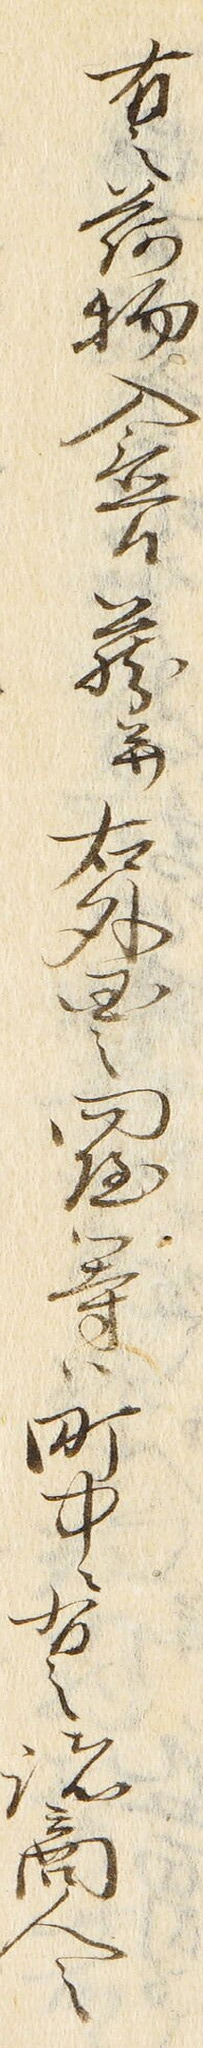有之荷物入置候蔵並右外国之四屋等は町中に有之諸商人之
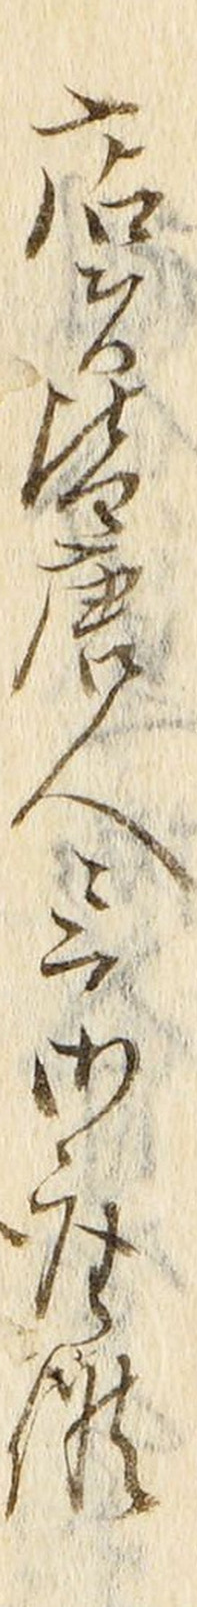店は皆唐人に而御座候
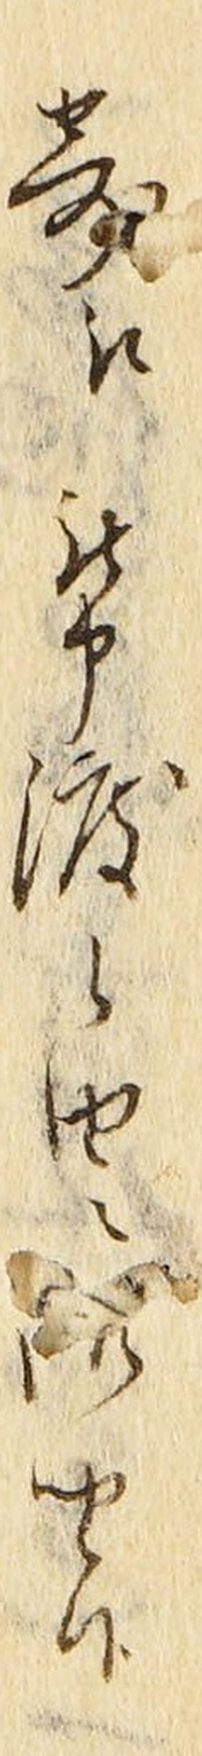寄江被申渡之由に御座候
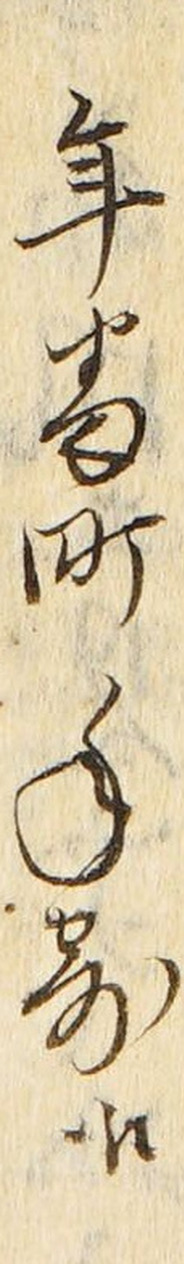年番町年寄江
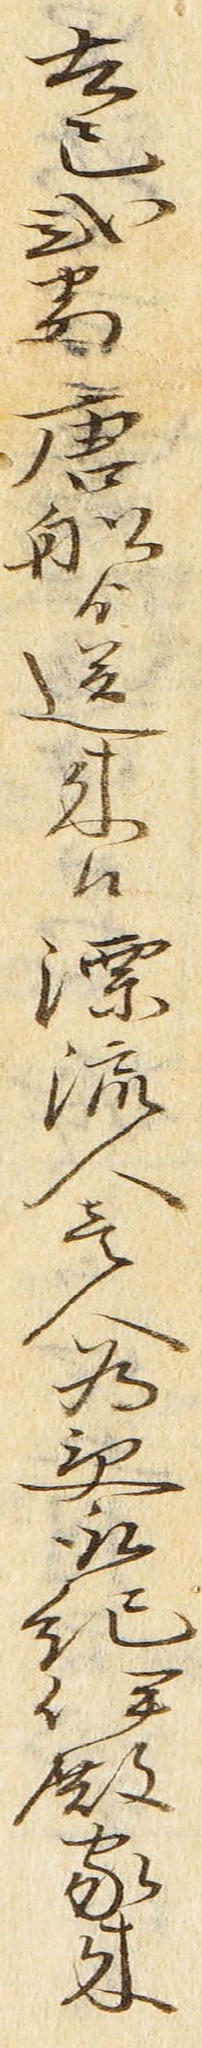右己弐叟唐船ゟ送来候漂流人壱人為受取紀伊殿家来
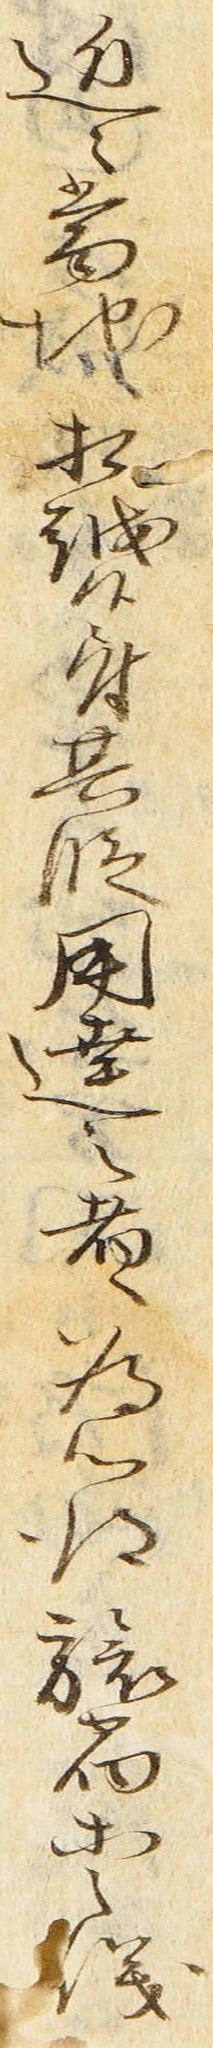追々当地へ相越候に付其段用達之者へ為心得に旅宿等之儀
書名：漂流人弥市之記
